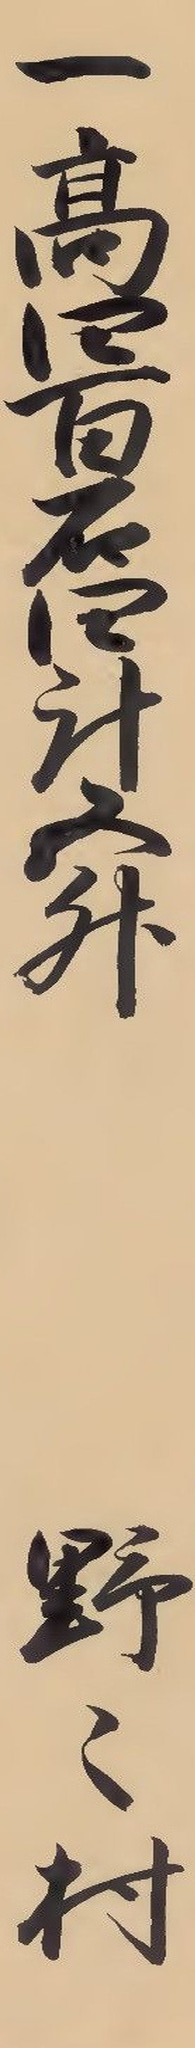一高四百石四斗五升野々村
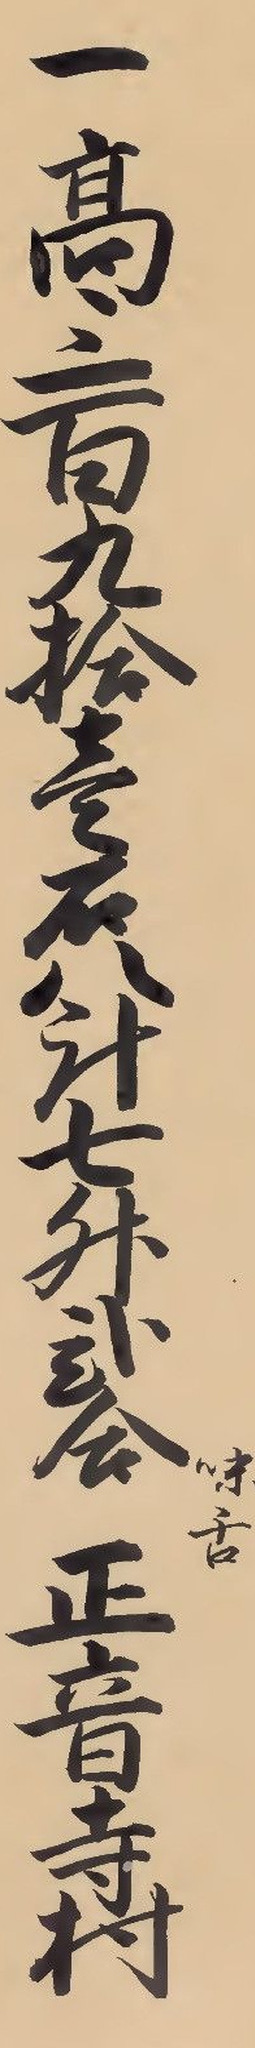一高三百九拾壱石八斗七升弐合正音寺村

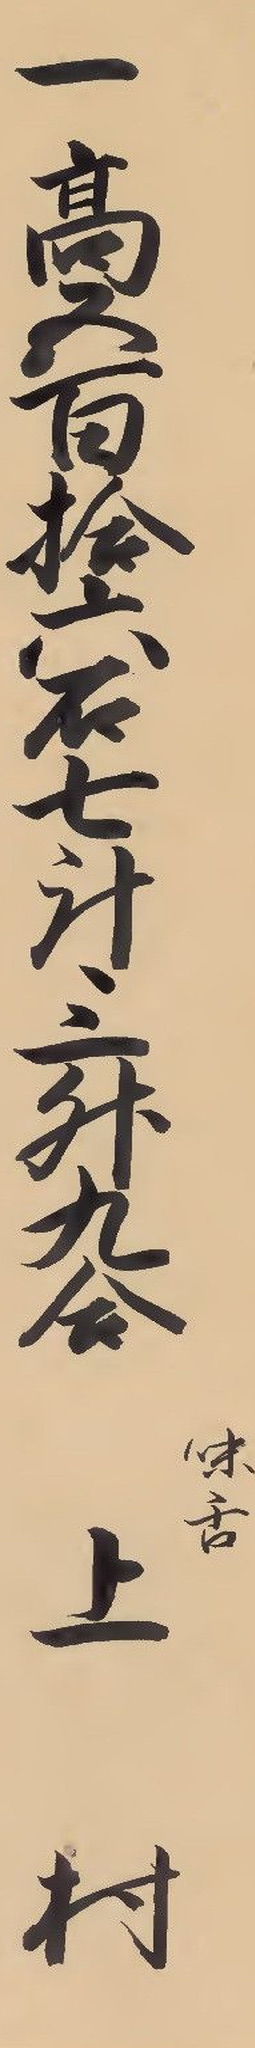一高五百拾六石七斗三升九合上村
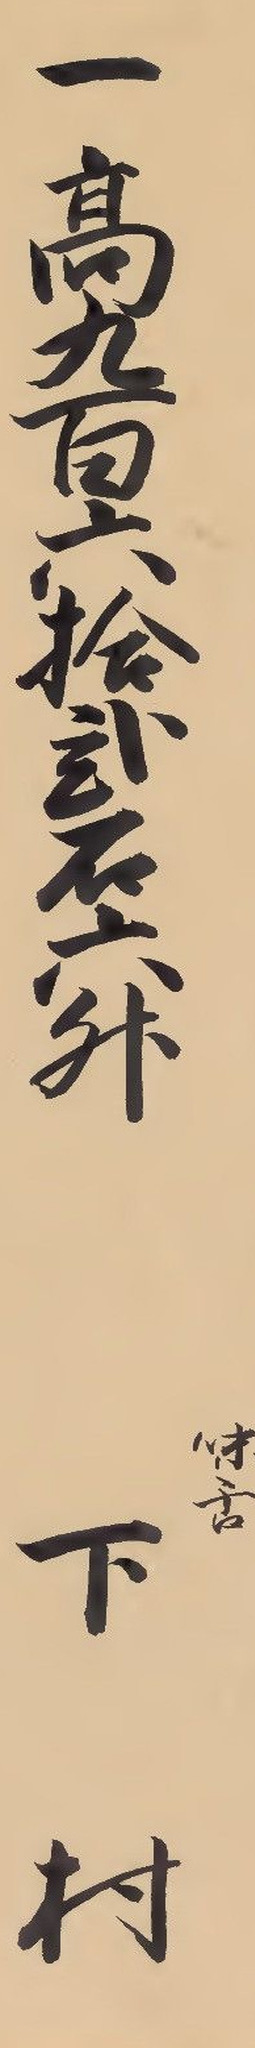一高九百六拾弐石六升下村
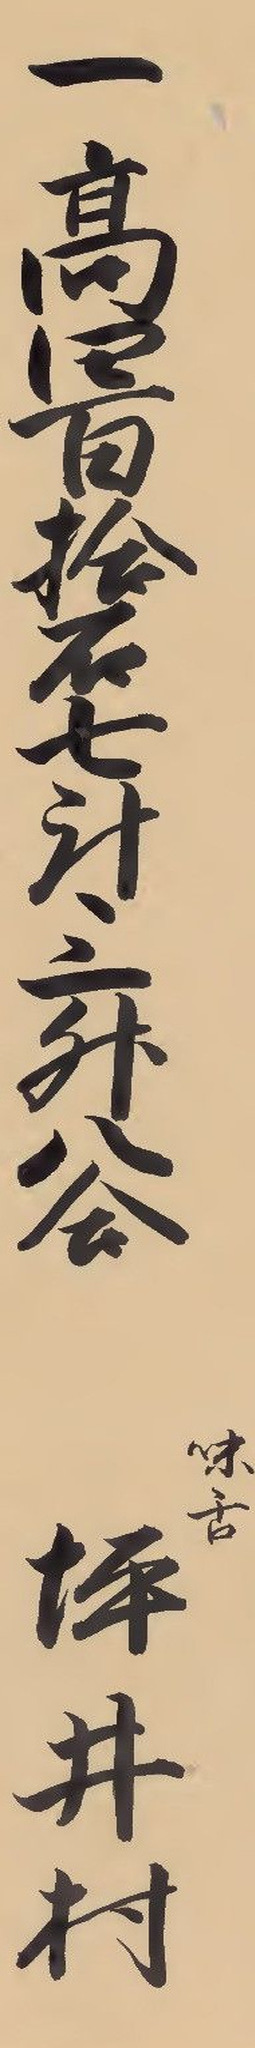一高四百拾石七斗三升八合坪井村
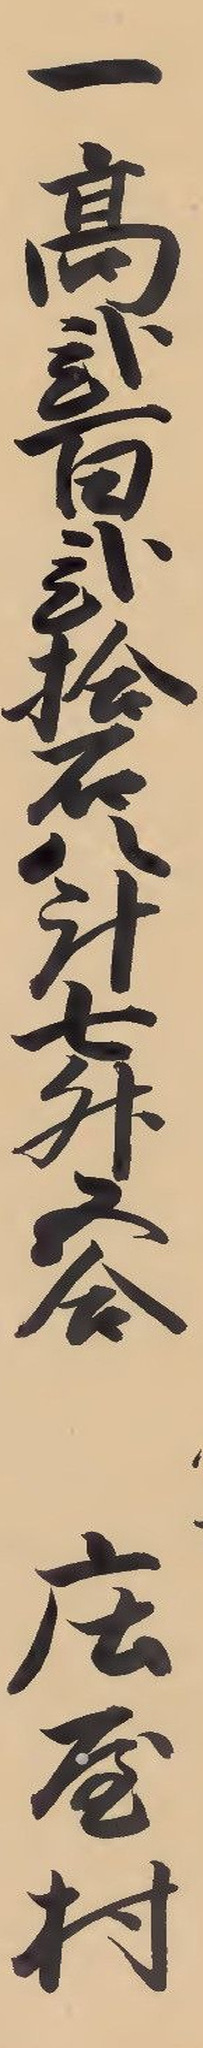一高二百弐拾石八斗七升五合庄屋村
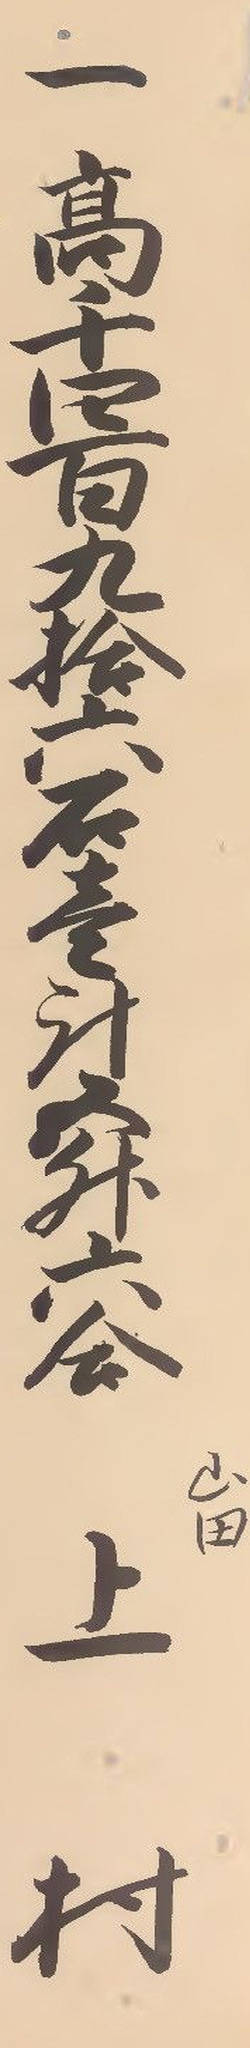一高千四百九拾六石壱斗五升六合上村
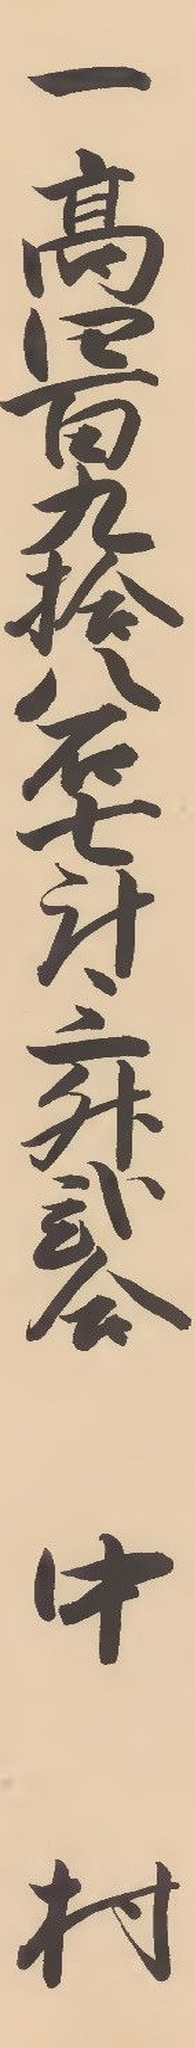一高四百九拾八石七斗三升弐合中村
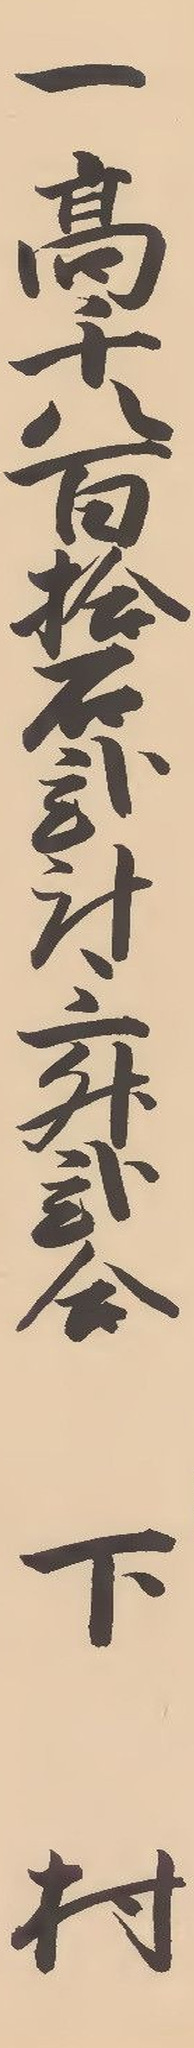一高千八百拾石弐斗三升弐合下村
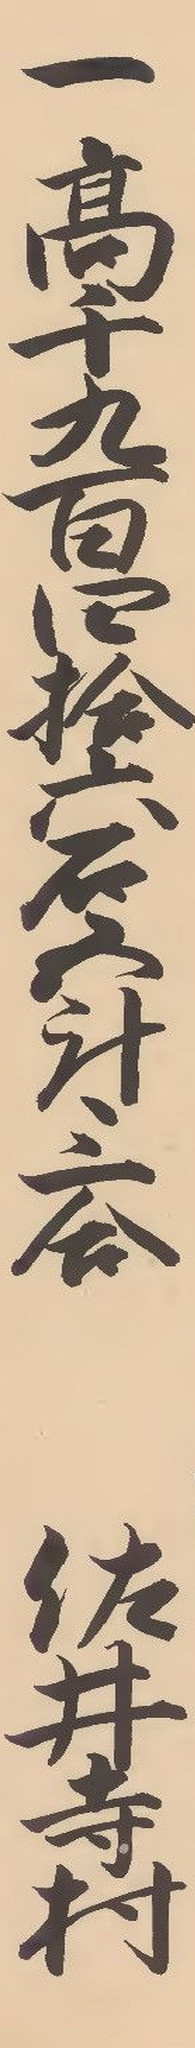一高千九百四拾六石五斗三合佐井寺村

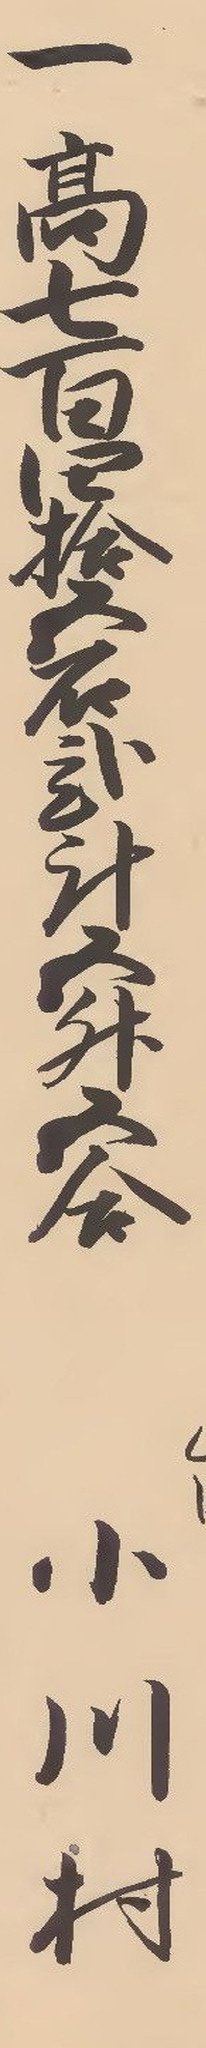一高七百四拾五石弐斗五升五合小川村
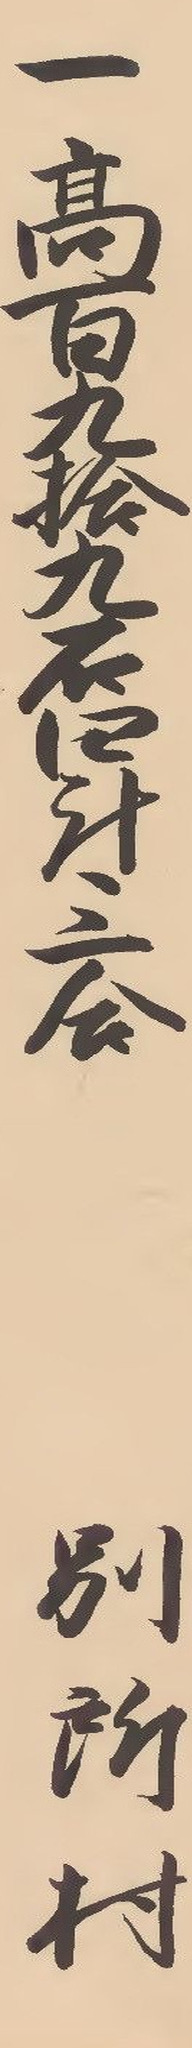一高百九拾九石四斗三合別所村
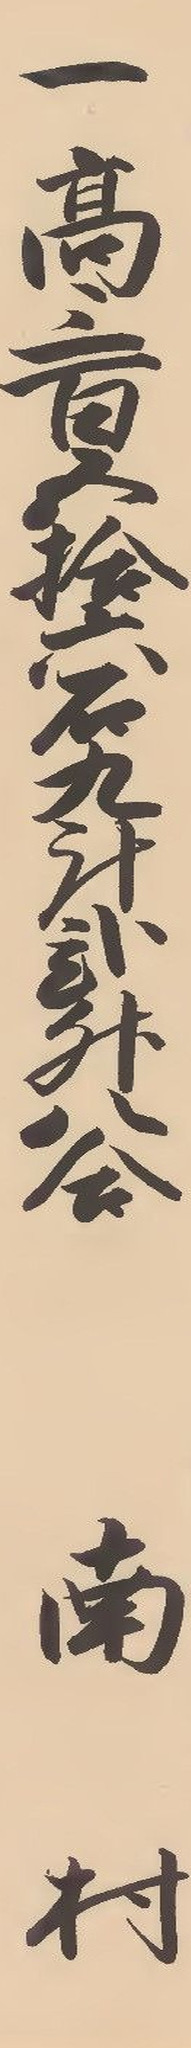一高三百五拾六石九斗弐升八合南村
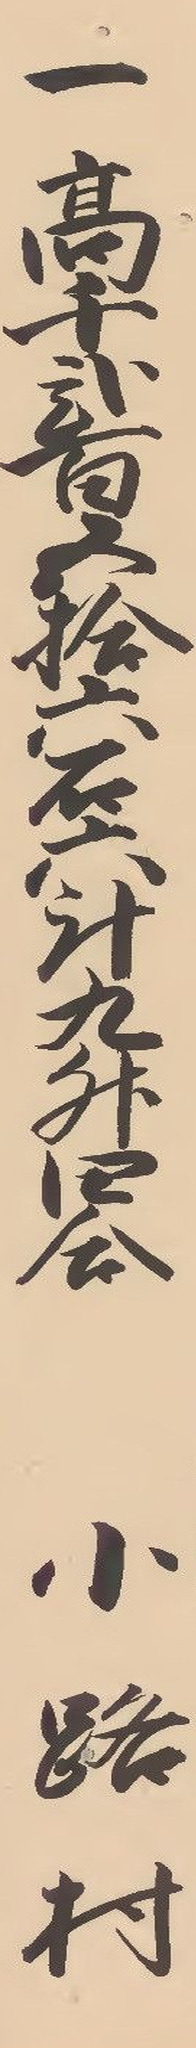一高千弐百五拾六石六斗九升四合小路村
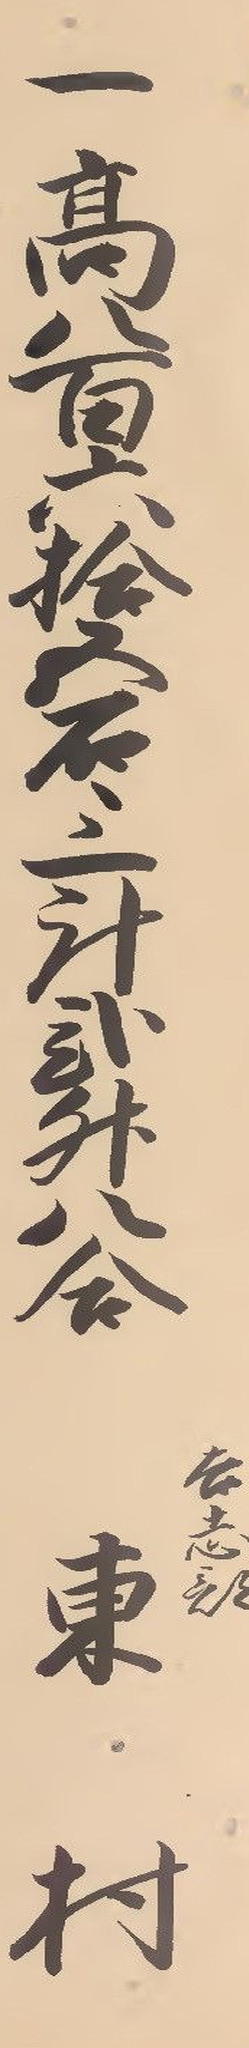一高八百六拾五石三斗弐升八合東村
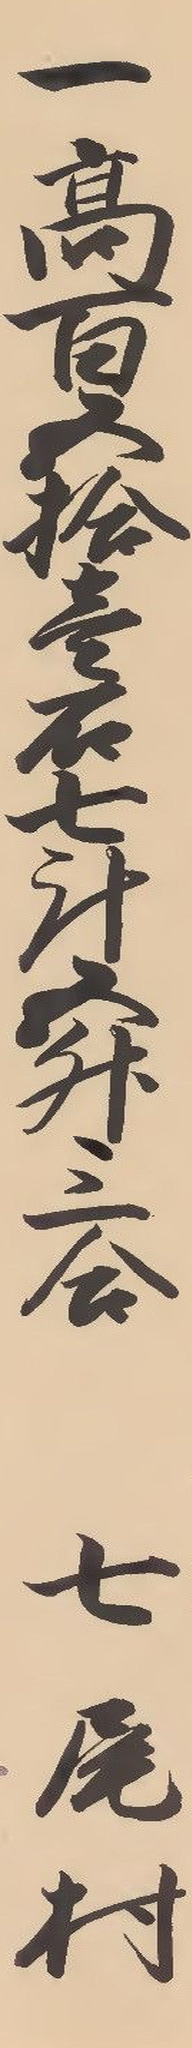一高百五拾壱石七斗五升三合七尾村
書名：摂津国郷帳
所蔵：国立公文書館 National Archives of Japan
